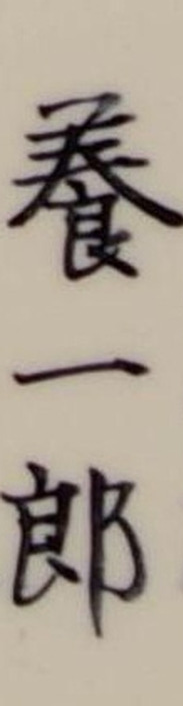養一郎
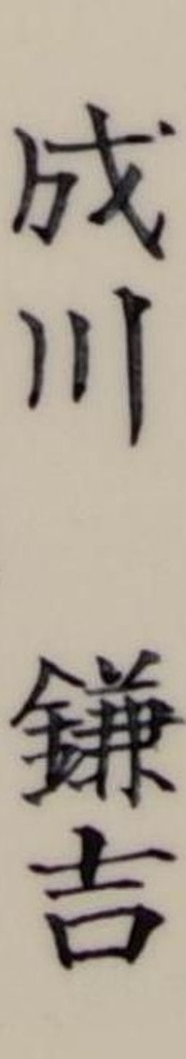成川鎌吉
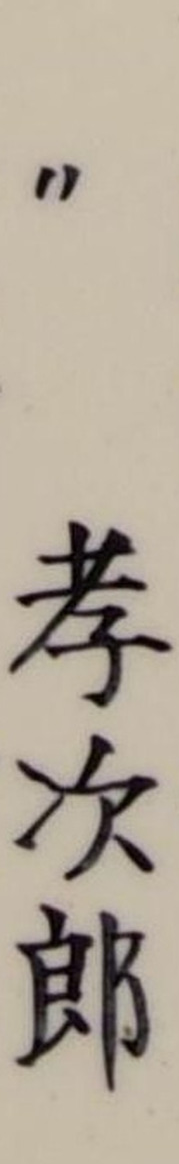孝次郎
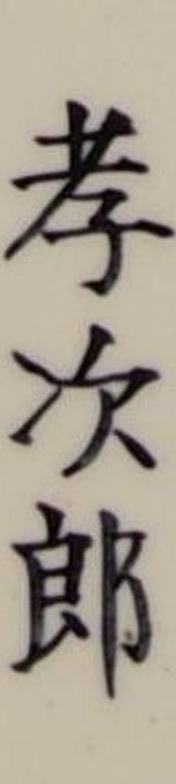孝次郎
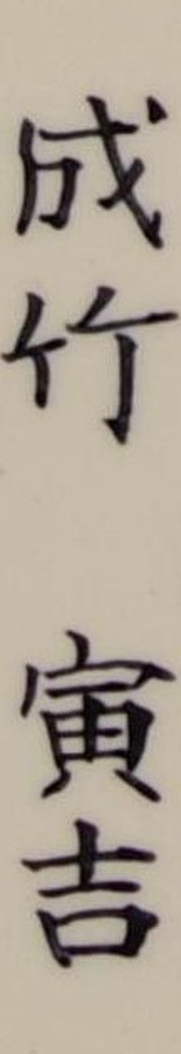成竹寅吉
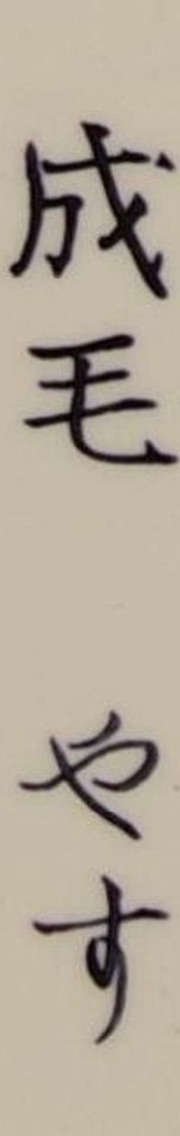成毛やす
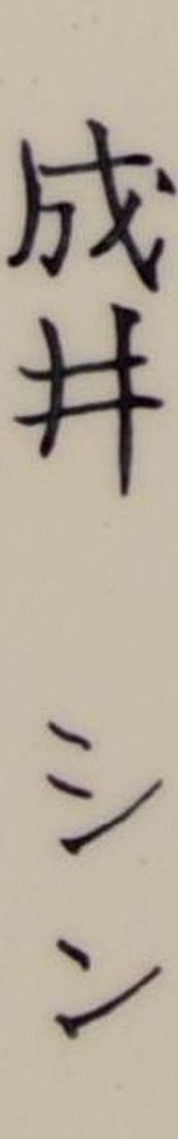成井シン
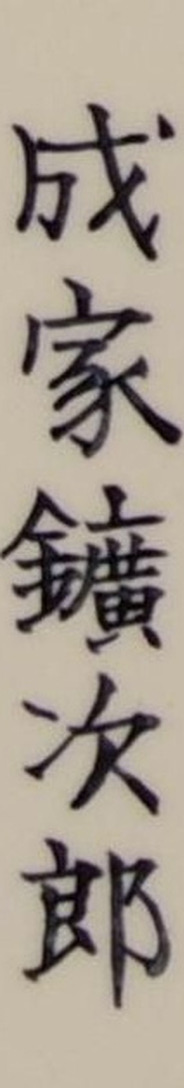成家鑛次郎
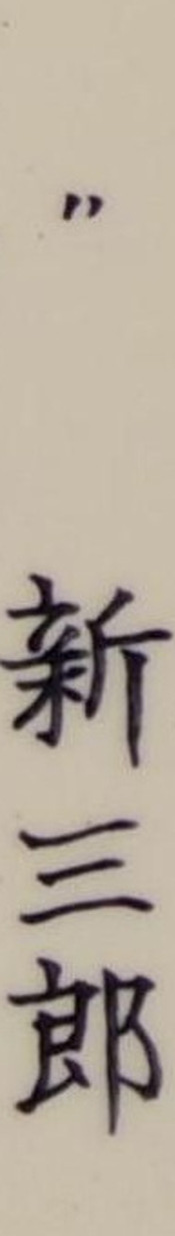新三郎
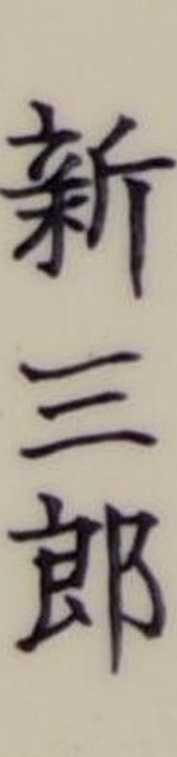新三郎
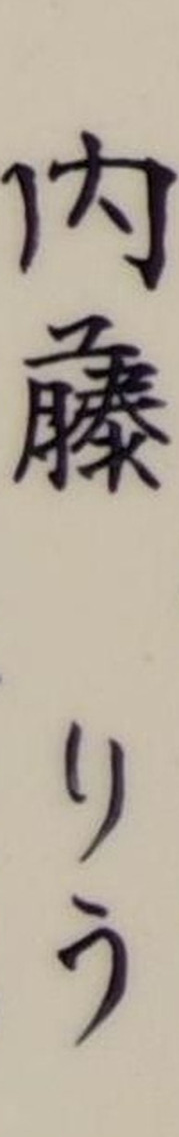内藤りう
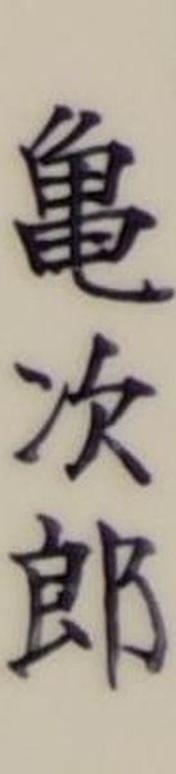亀次郎

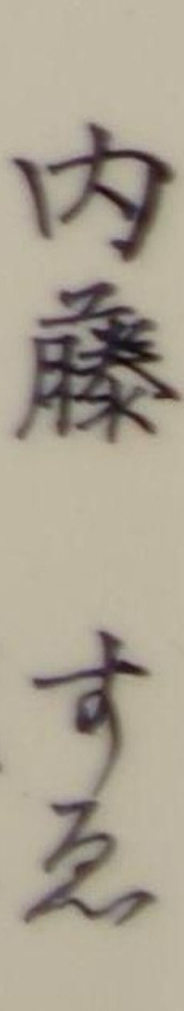内藤すえ
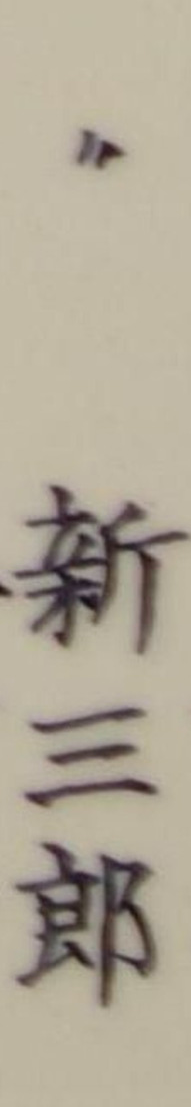新三郎
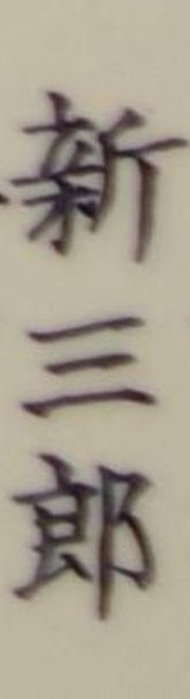新三郎
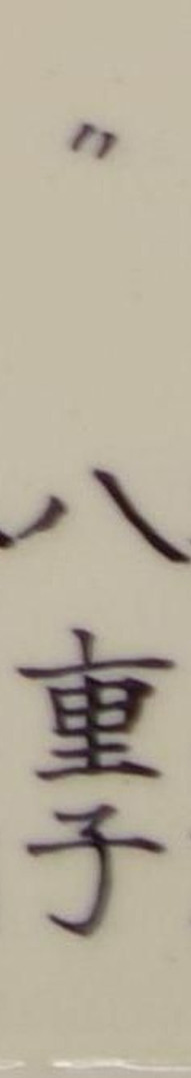八重子
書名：M~S
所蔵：高野山金剛峯寺
